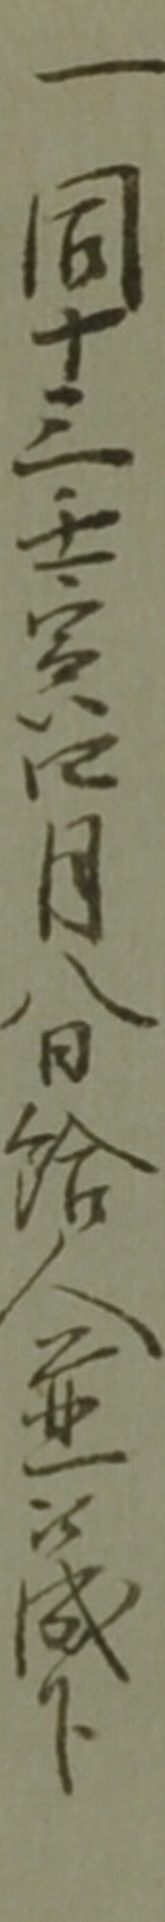一同十三日壬寅四月八日給人並被成下
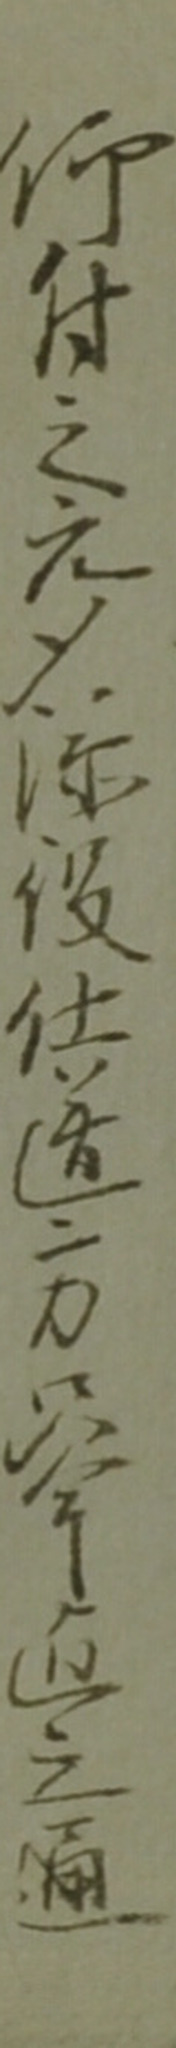仰付之元〆添役仕送方只今迄之通
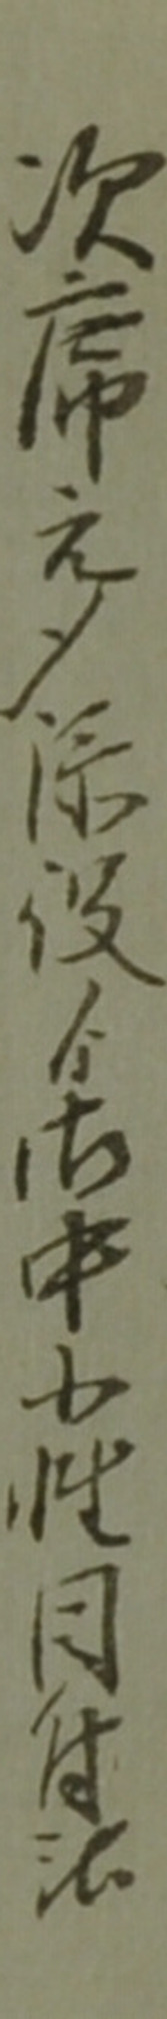次席元〆添役より御中小姓目付被
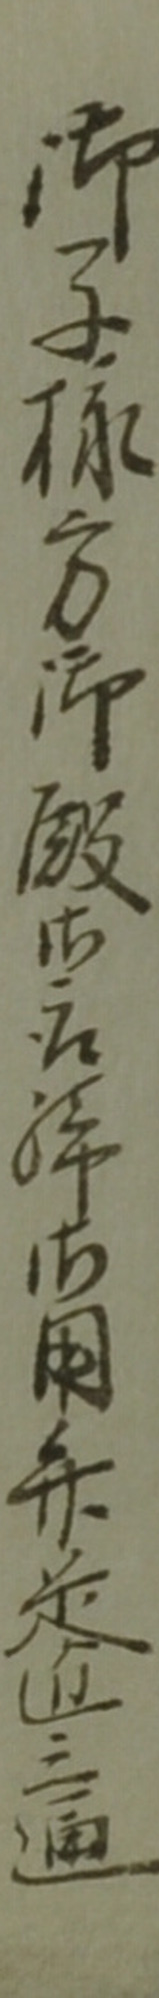御子様方御殿御取締御用弁是迄之通
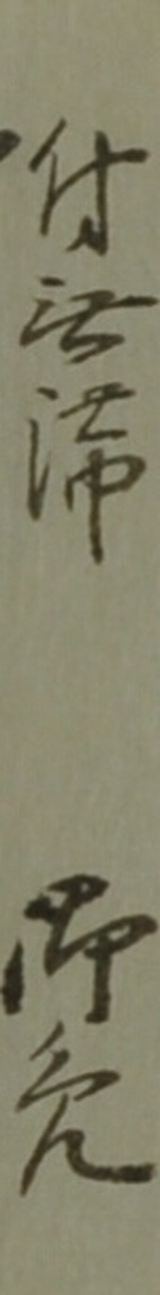付無滞御免
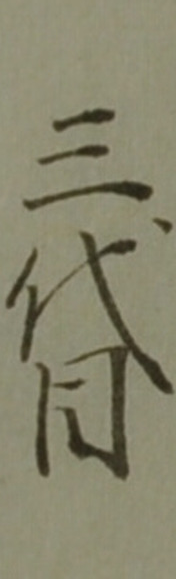三代目
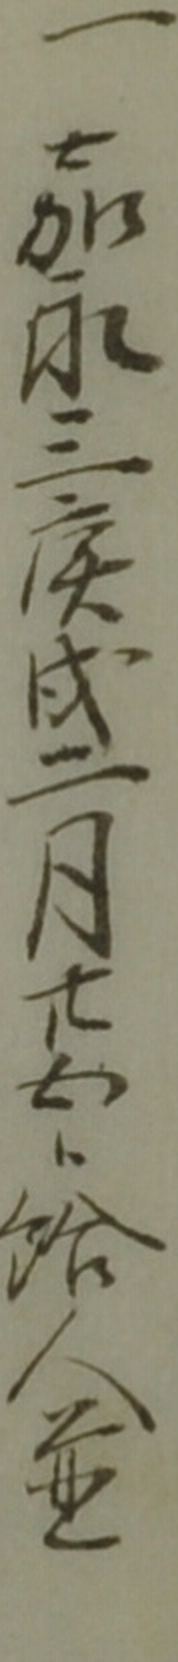一嘉永三庚戌二月廿五日給人並
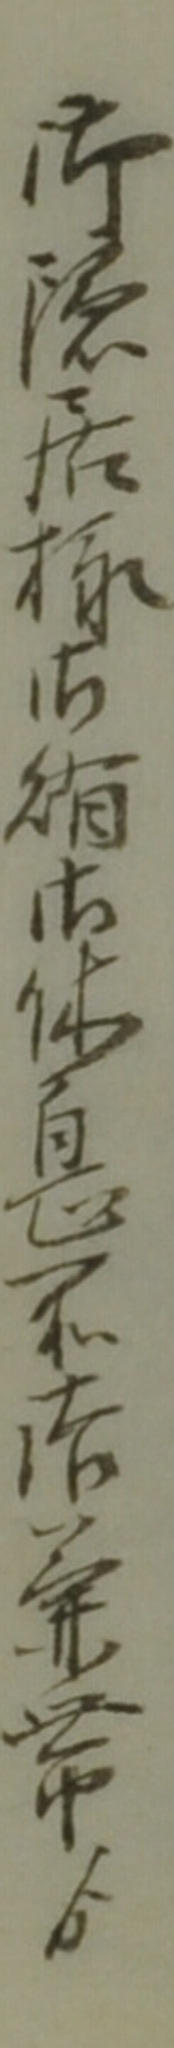御隠居様御賄御休息所詰兼帯より
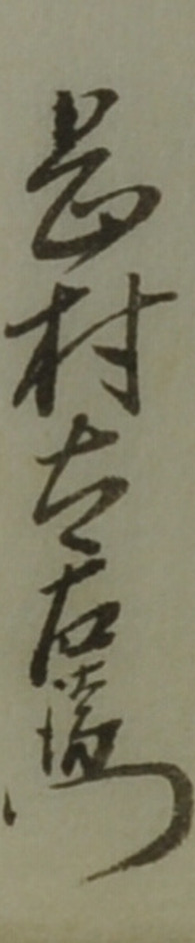岡村太右衛門
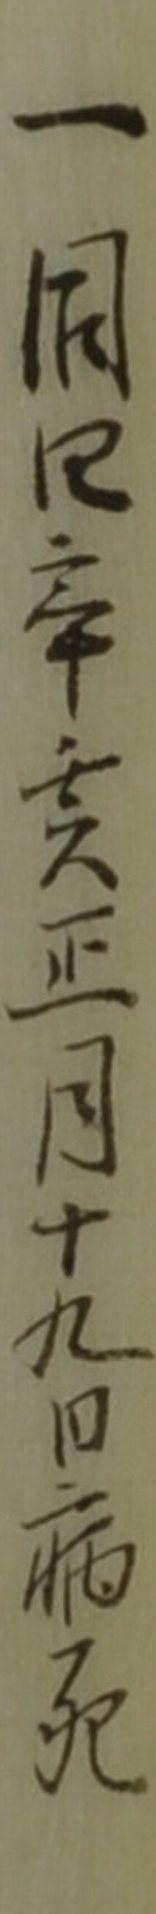一同四辛亥正月十九日病死
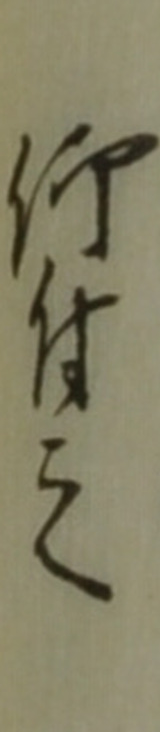仰付之
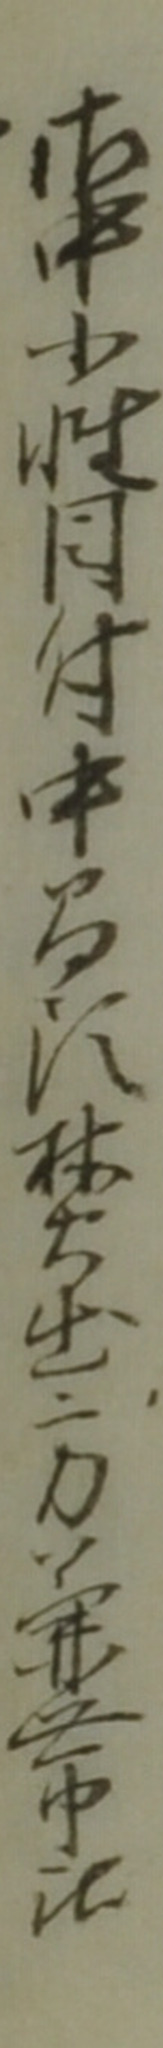御中小姓目付中間頭焚出方兼帯被

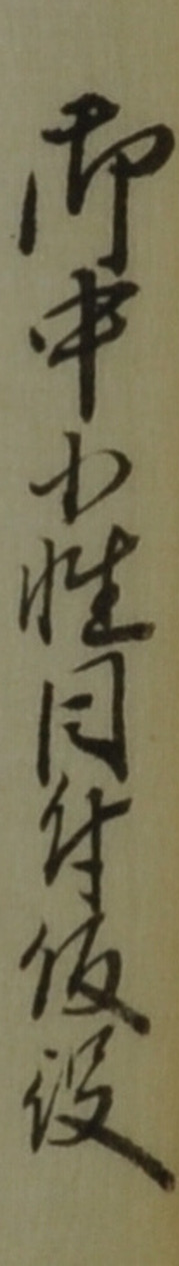御中小姓目付仮役
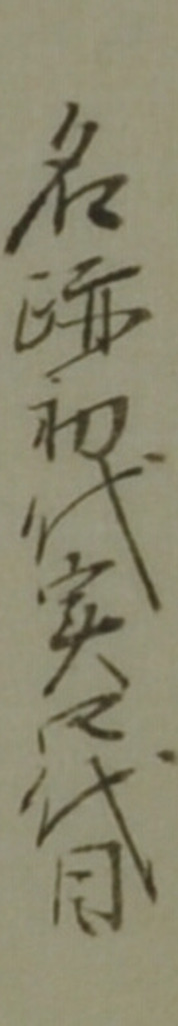名跡初代実四代目
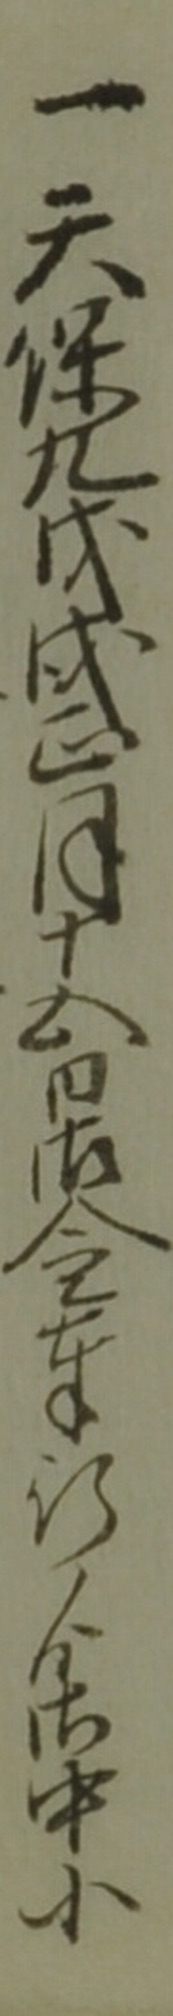一天保九戊戌正月十五日御金奉行より御中小
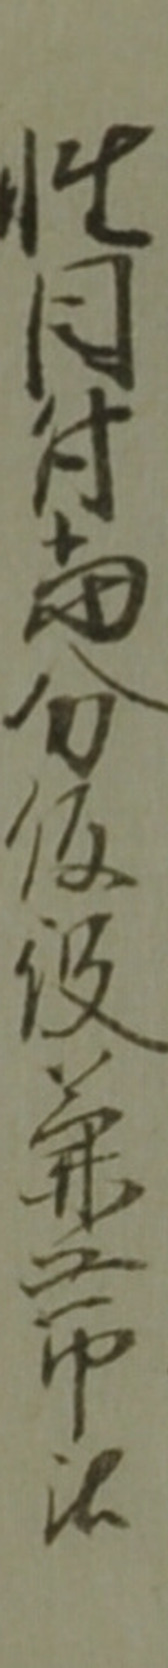姓目付当分仮役兼帯被
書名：諸御役代々録（八）
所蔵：伊那市立高遠町図書館・合同会社AMANE
